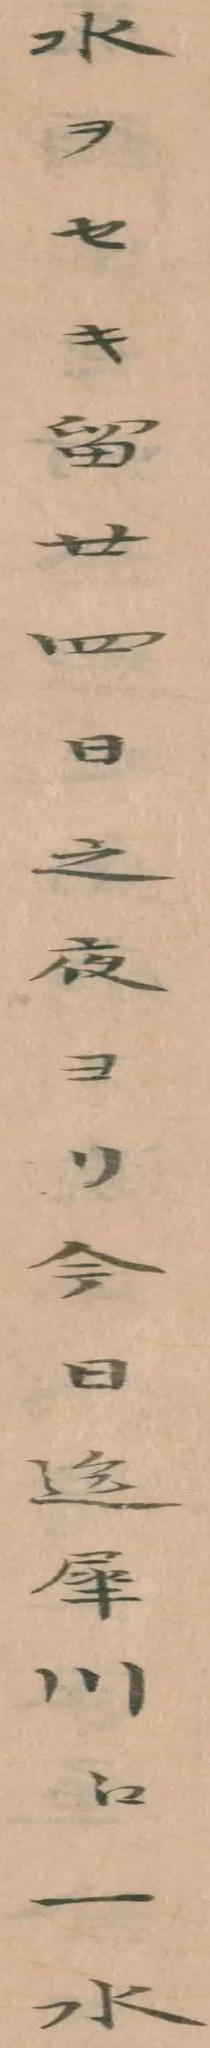水ヲセキ留廿四日之夜ヨリ今日迄犀川江一水
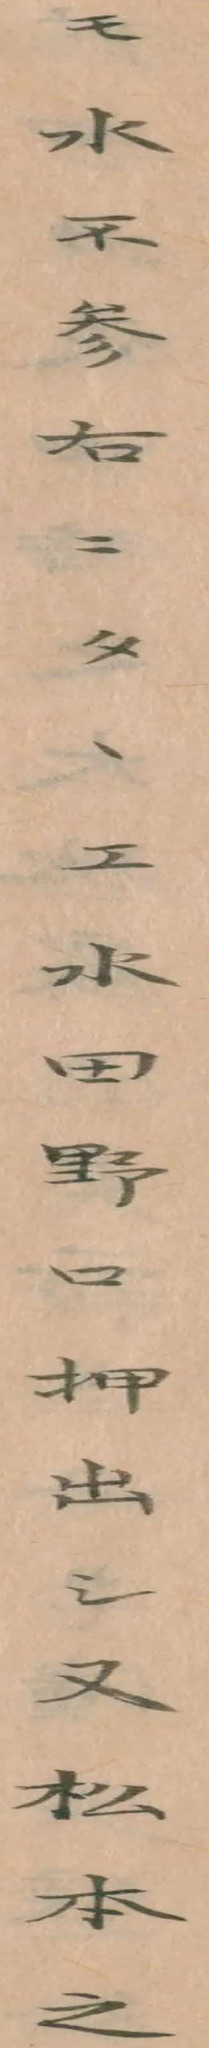モ水不参右二タゝエ水田野口押出シ又松本之
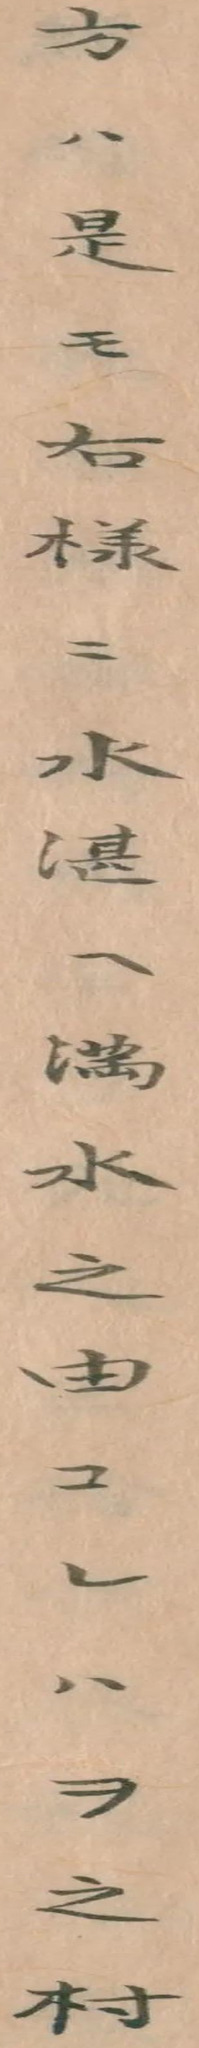方ハ是モ右様二水湛へ満水之由コレハヲ之村
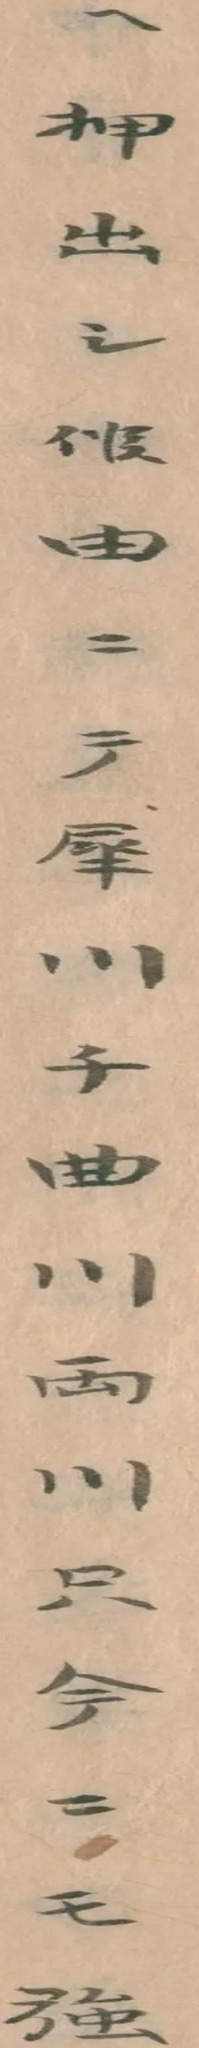へ押出シ候由ニテ犀川千曲川両川只今ニモ強
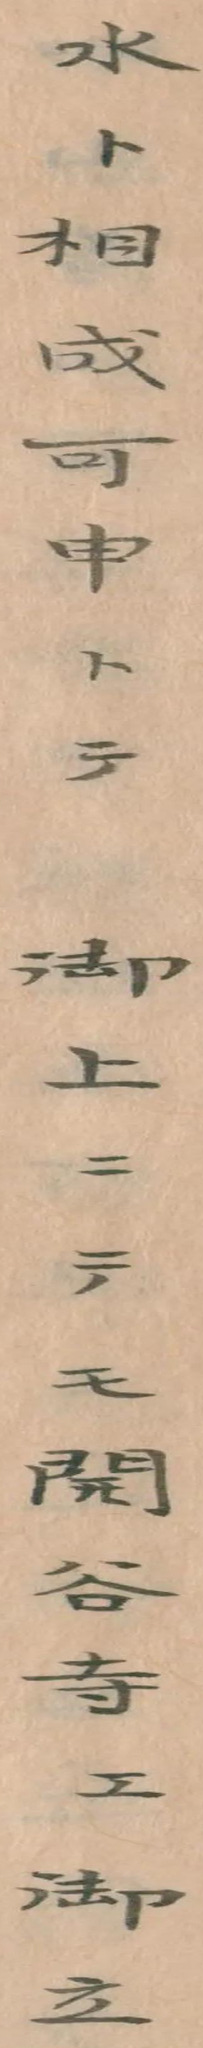水ト相成可申トテ御上ニテモ開谷寺エ御立
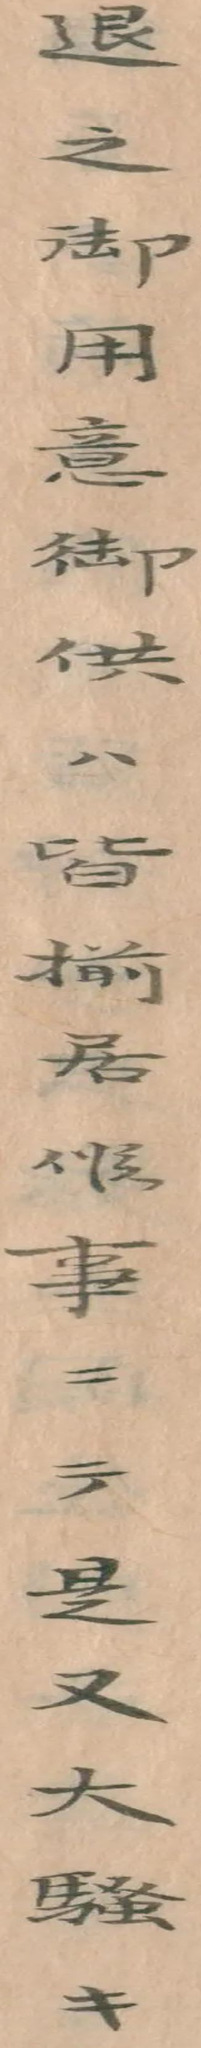退之御用意御供ハ皆揃居候事ニテ是又大騒キ
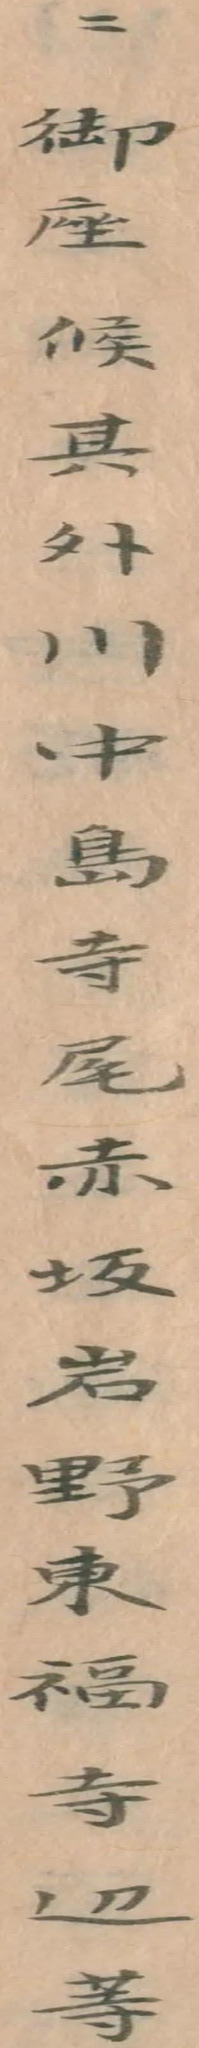二御座候其外川中島寺尾赤坂岩野東福寺辺等

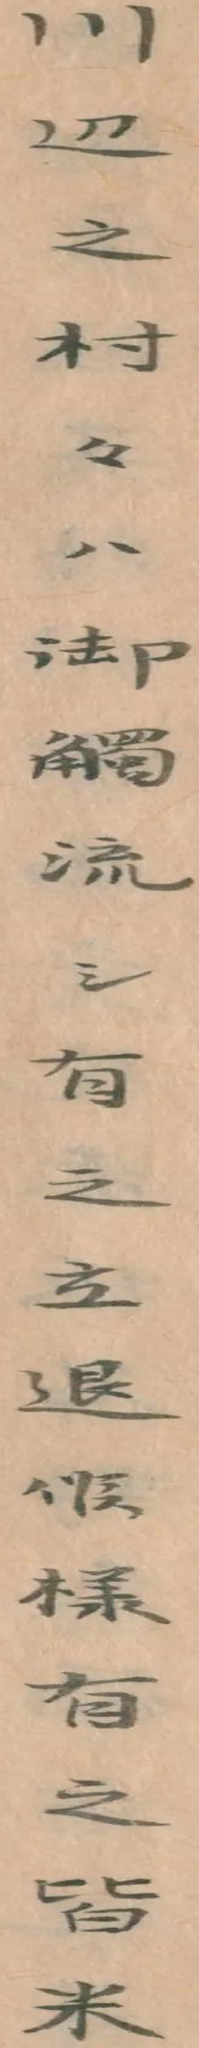川辺之村々ハ御降流シ有之立退候様有之皆米
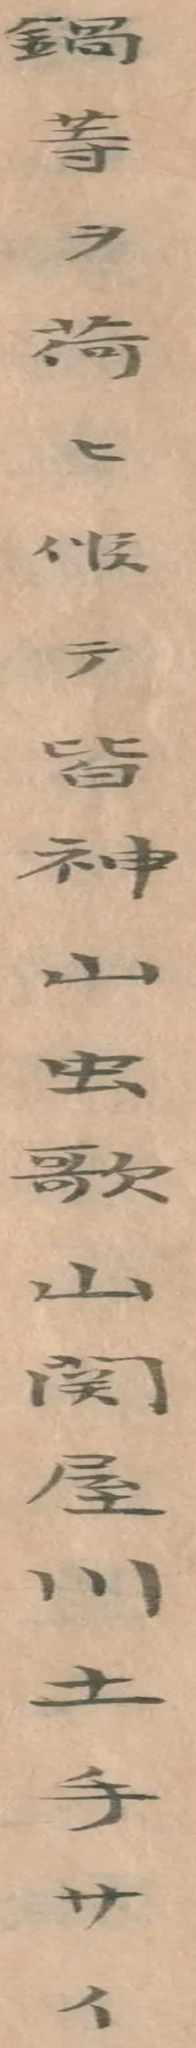鍋等ヲ荷ヒ候テ皆神山虫歌山関屋川土手サイ
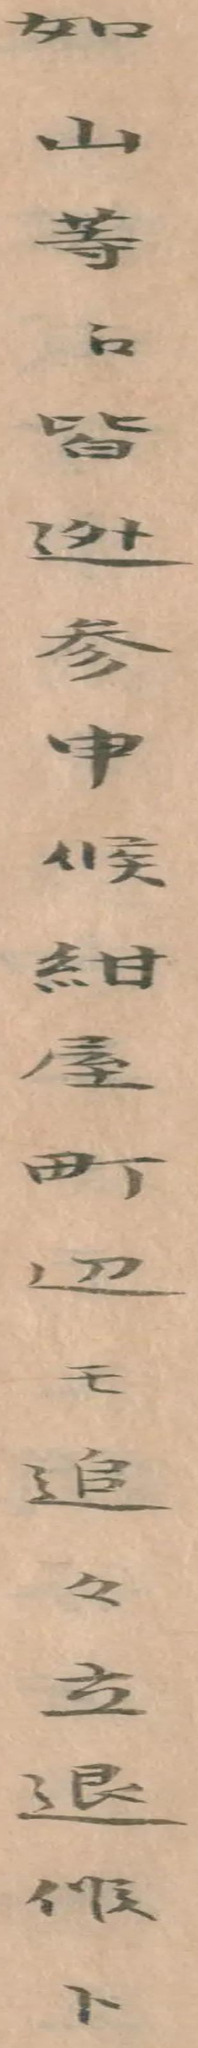如山等皆江逃参申候紺屋町辺モ追々立退候ト
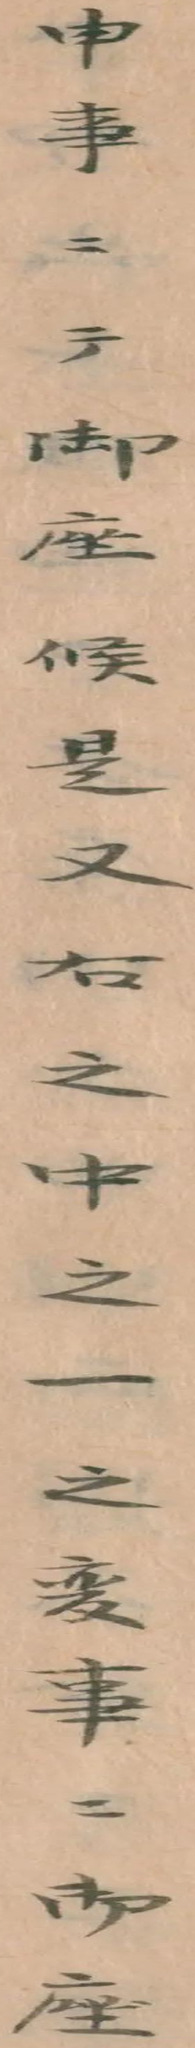申事ニテ御座候是又右之中之一之変事二御座
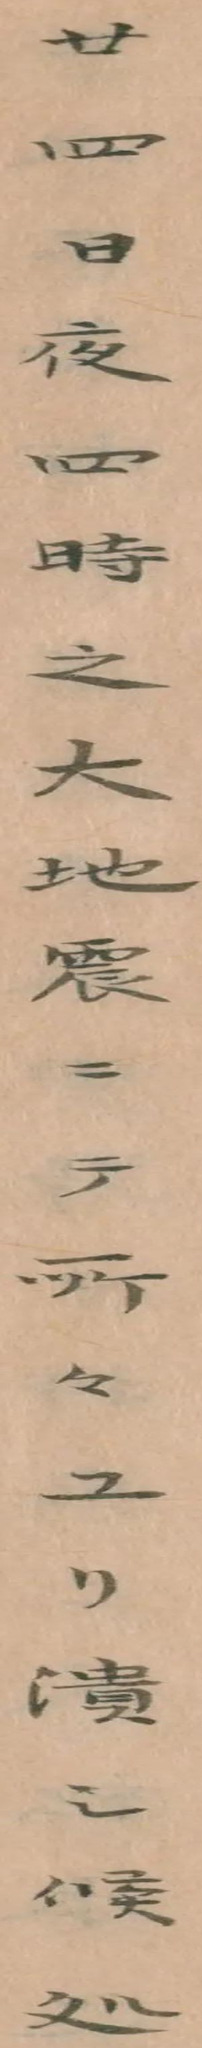廿四日夜四時之大地震ニテ所々ユリ潰シ候処
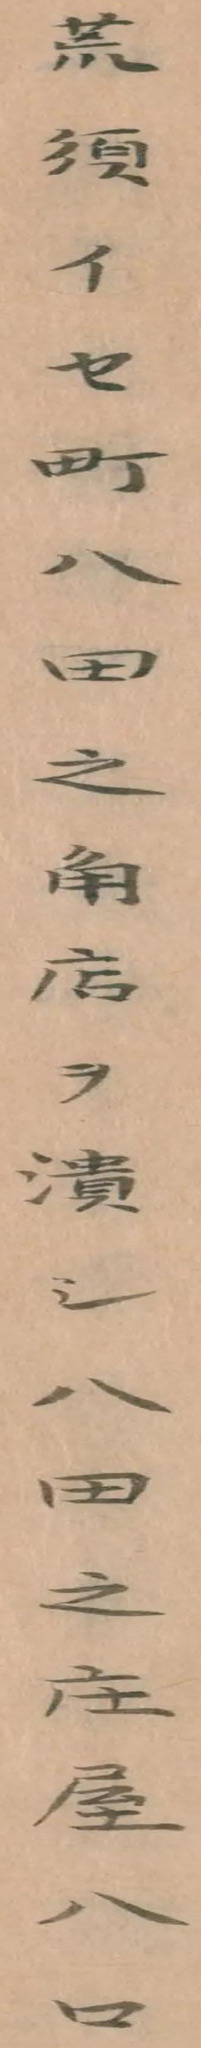荒須イセ町八田之角店ヲ潰シ八田之庄屋八口
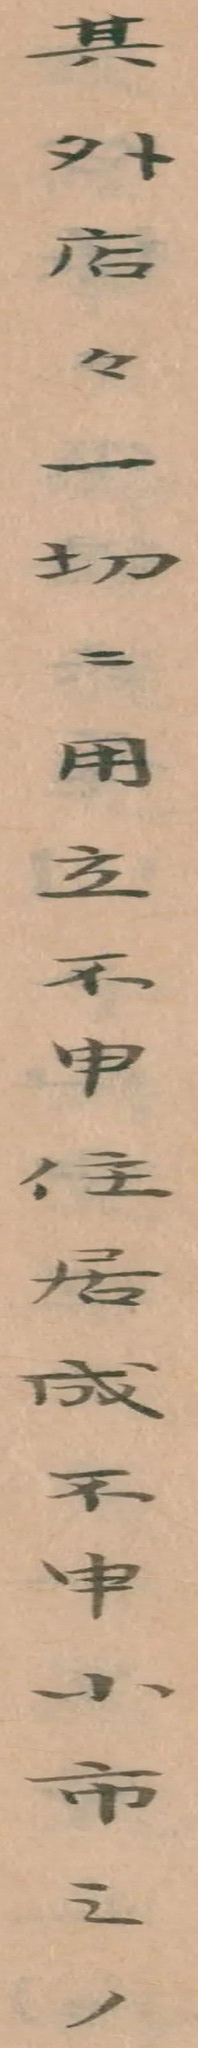其外店々一切二用立不申住居成不申小市ミノ
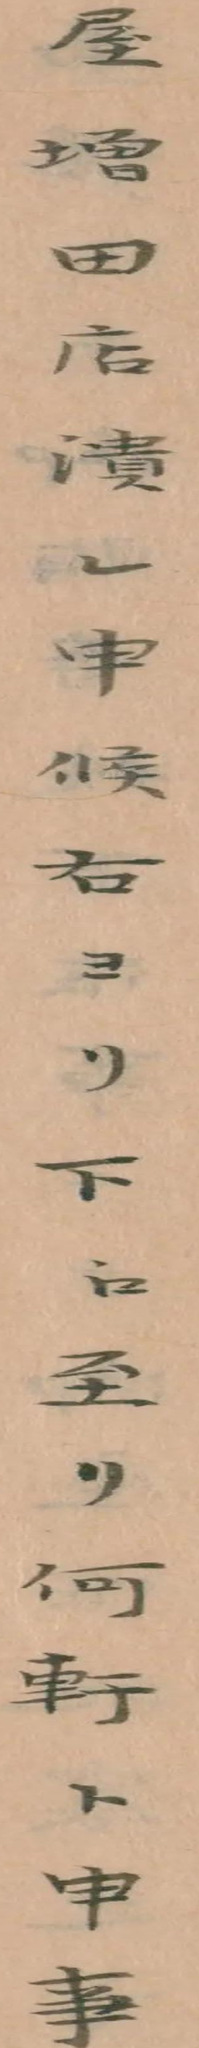屋増田店潰レ申候右ヨリ下江至り何軒ト申事
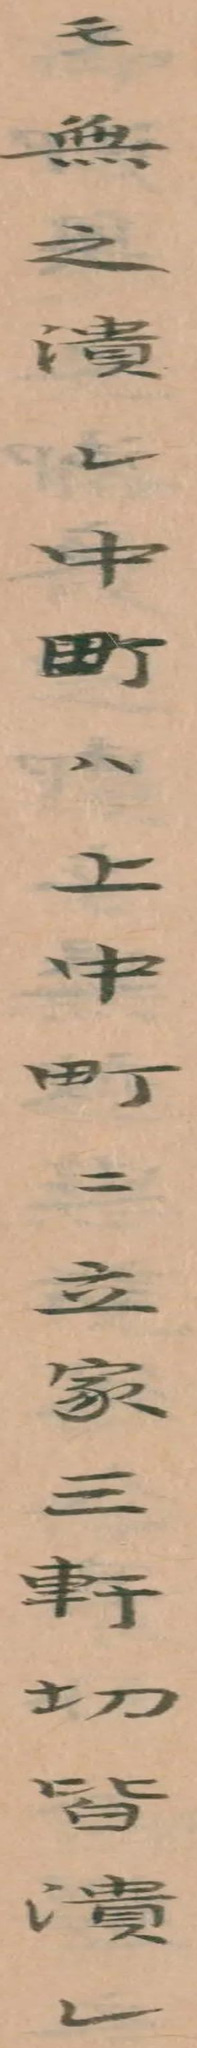モ無之潰レ中町ハ上中町二立家三軒切皆潰レ
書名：地災撮要. 巻1(噴火山・地震ノ部)
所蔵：国立国会図書館 National Diet Library, JAPAN
